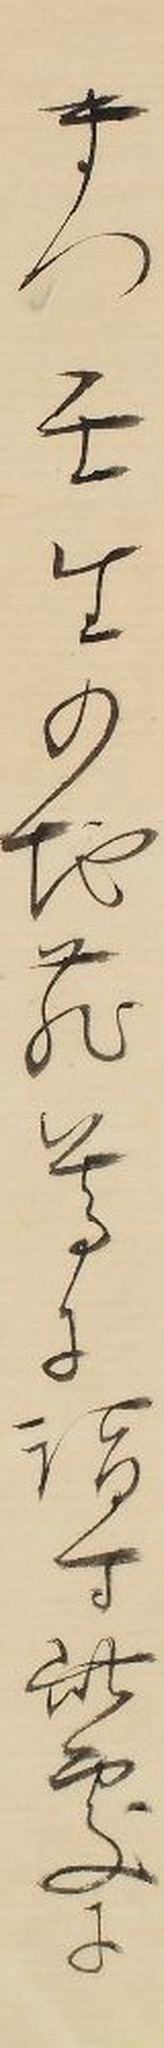まつ壬生の地蔵尊に詣す此処に
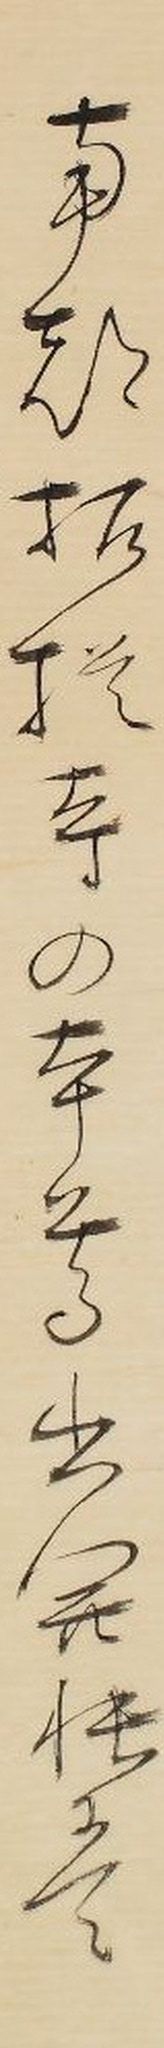南都招提寺の本尊出開帳にて
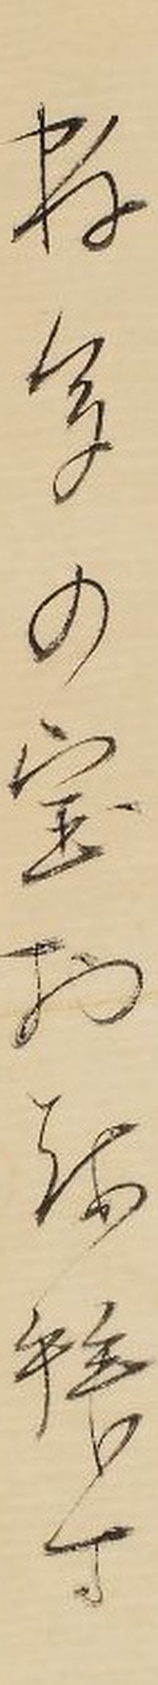数多の宝物を拝す
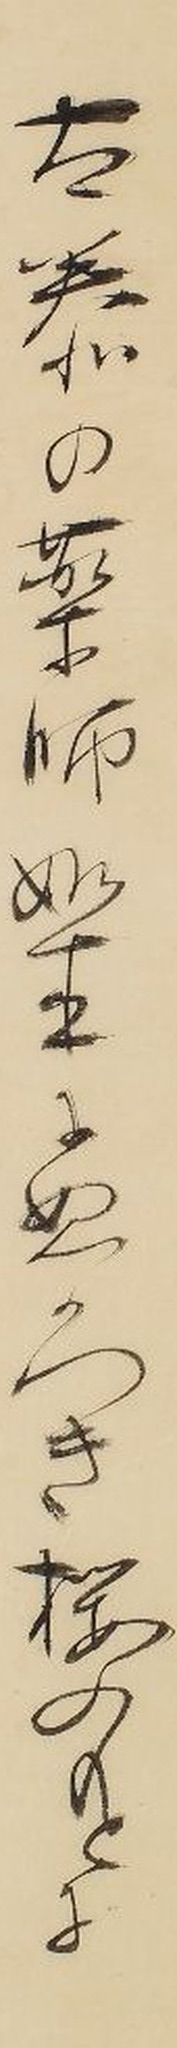太秦の薬師如来にぬかつき桜のもとに
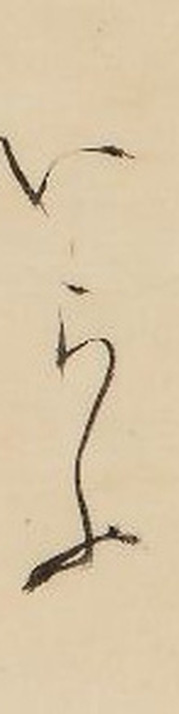いらふ
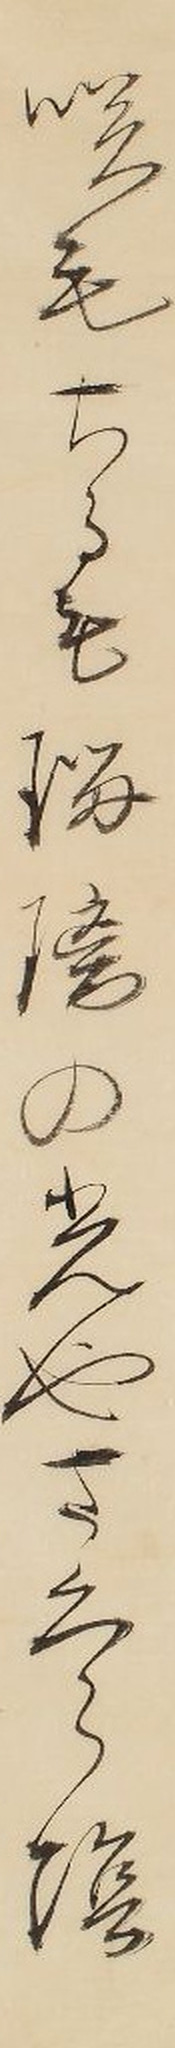咲もちるも瑠璃の光やさくら陰
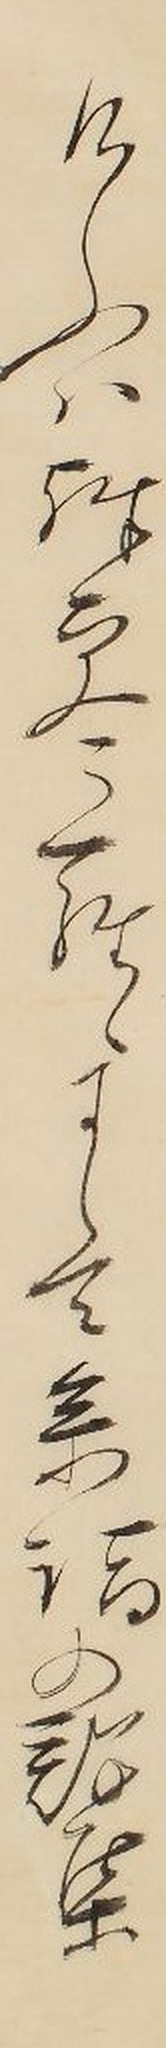けふは殊更うらゝにして参詣の群集
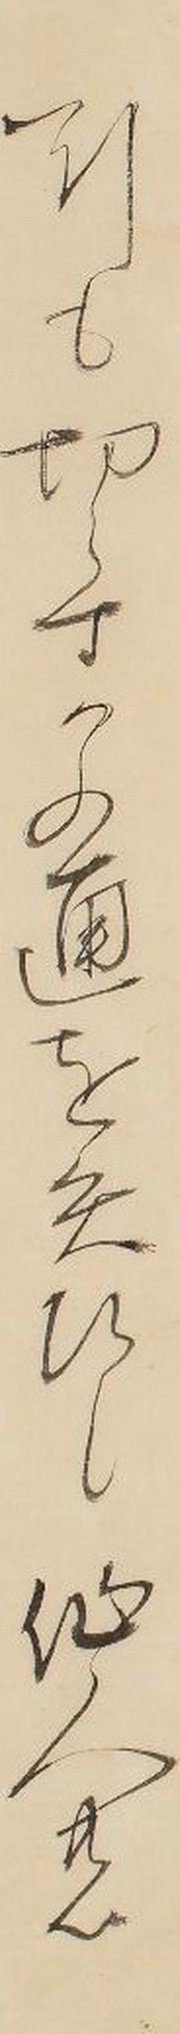引も切らすかの通を失ひし仙人の
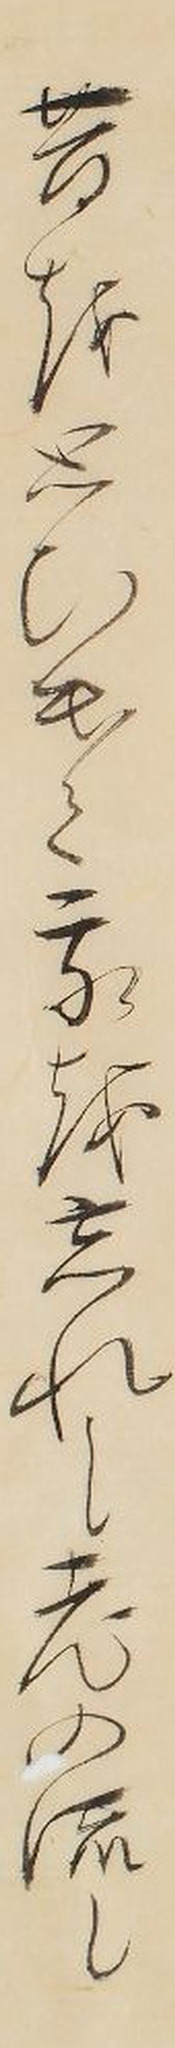昔を思ひ出て我を忘れし老の流し
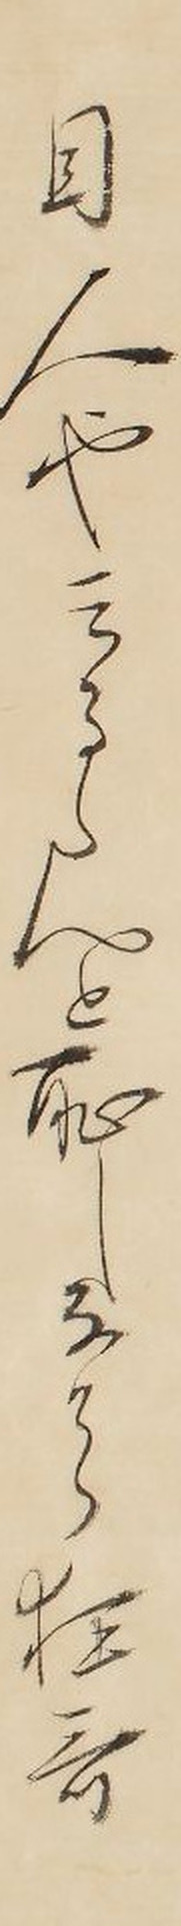目人やみるらんと恥しなから狂歌
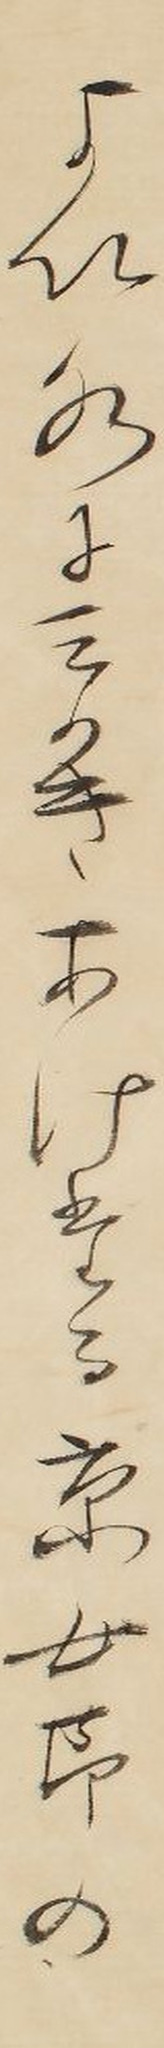よい水にみかきあけたる京女郎の
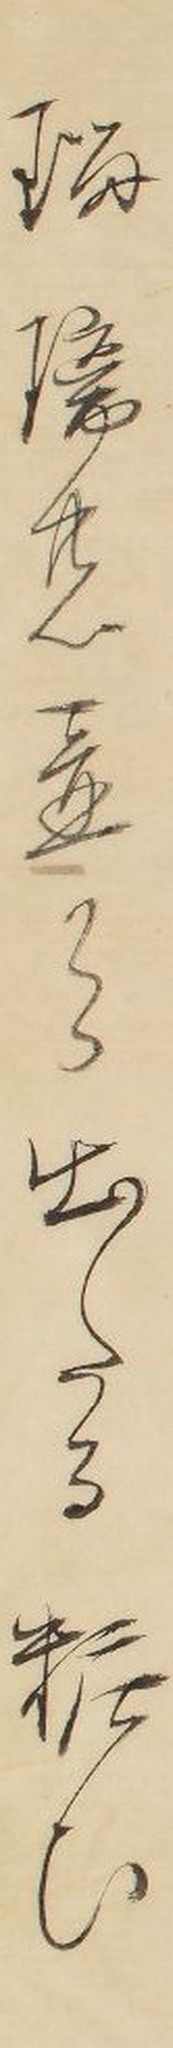瑠璃の壺から出たる粧ひ

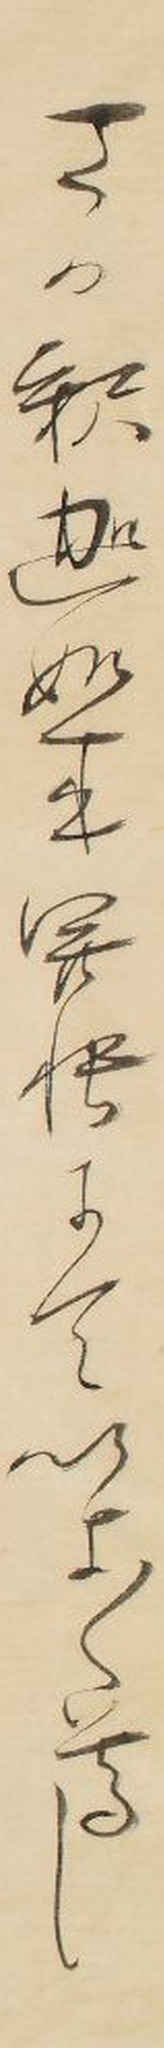さる釈迦如来開帳にていよ〳〵尊し
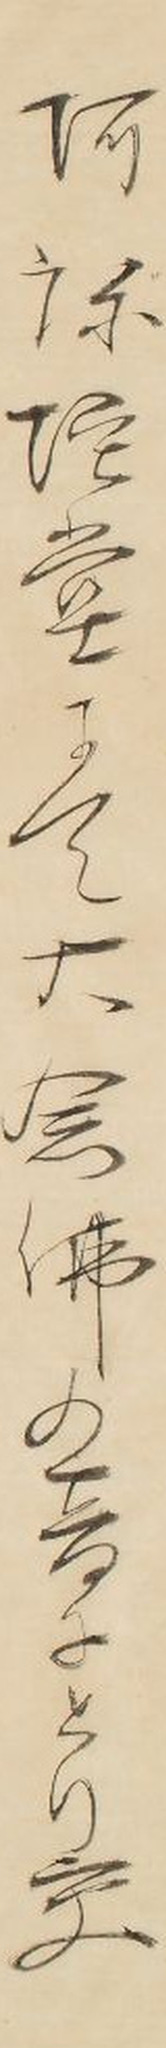阿弥陀堂にて大念仏の音にとり交
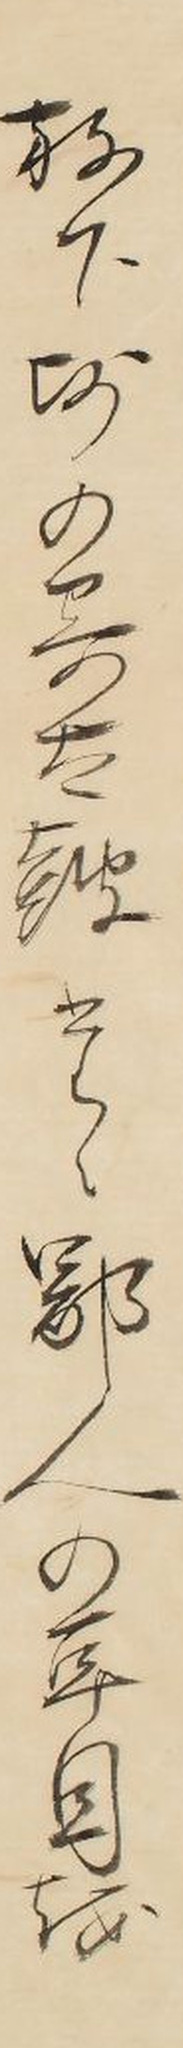放下師の寄太皷たゝ鄙人の耳目を
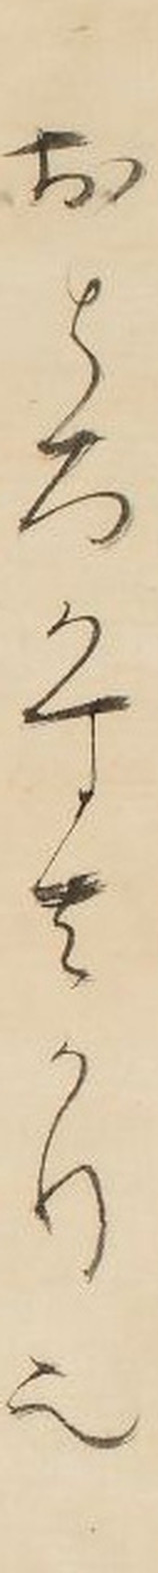おとろかすはかり也
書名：花土産
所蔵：徳島県立図書館
